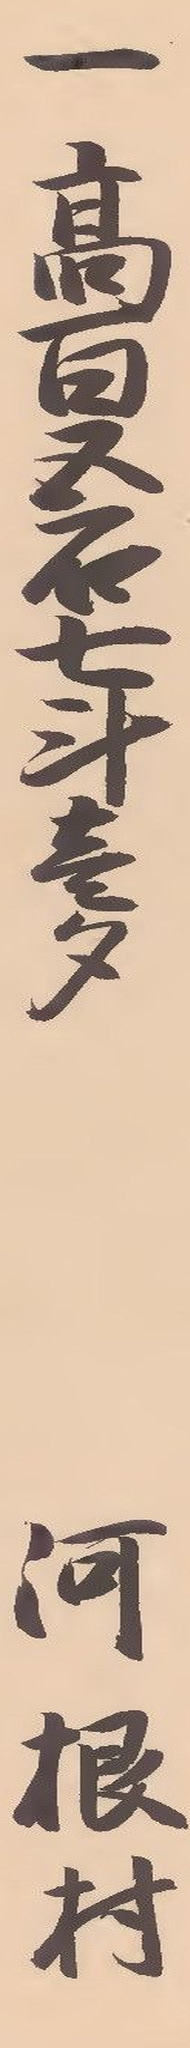一高百五石七斗壱勺河根村
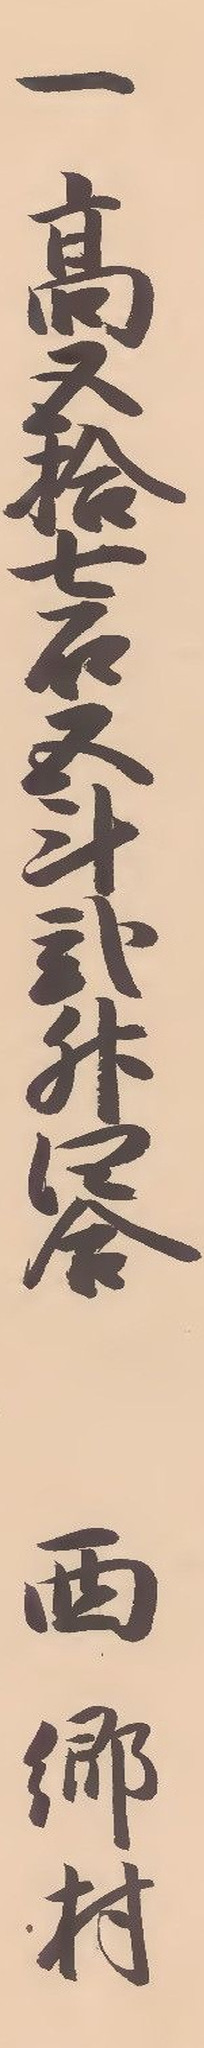一高五拾七石五斗弐升四合西郷村
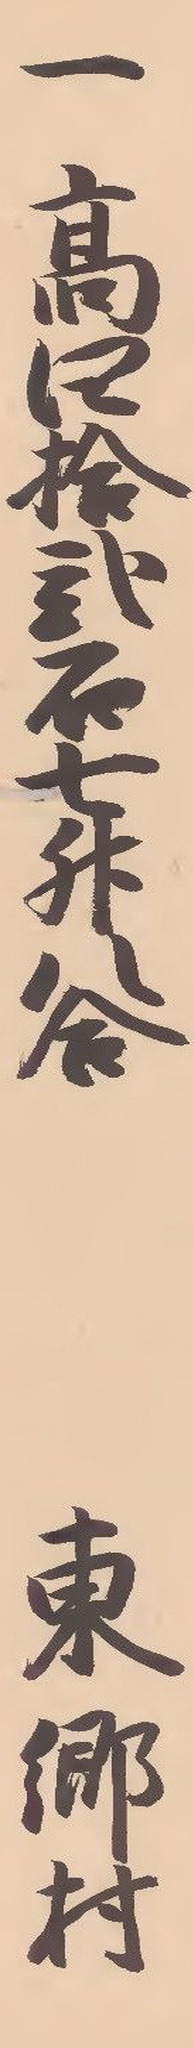一高四拾弐石七升八合東郷村

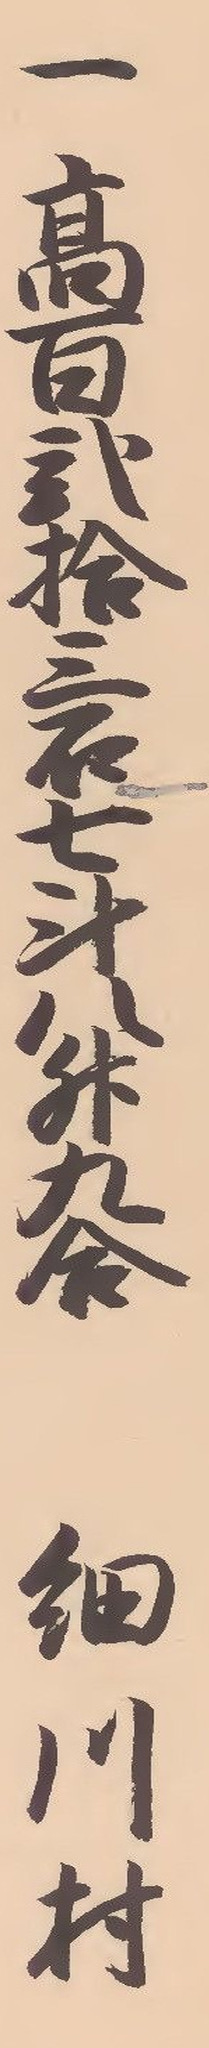一高百弐拾三石七斗八升九合細川村
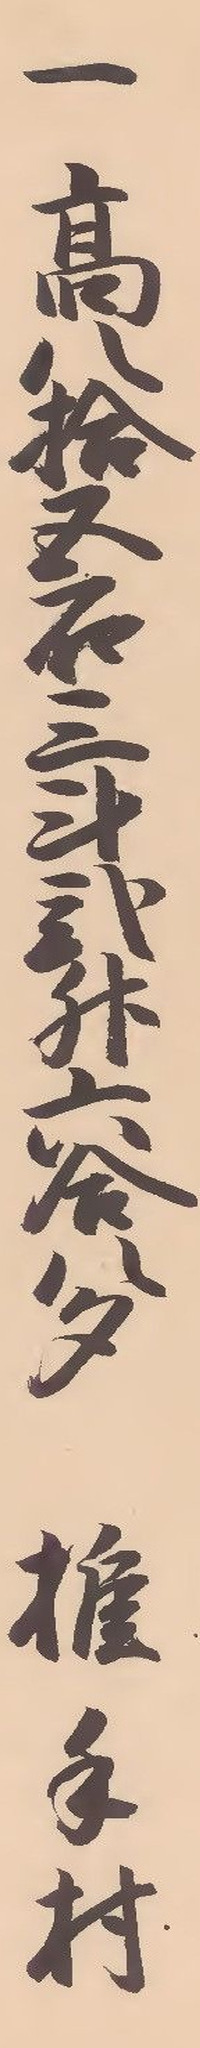一高八拾五石三斗弐升六合八勺推手村
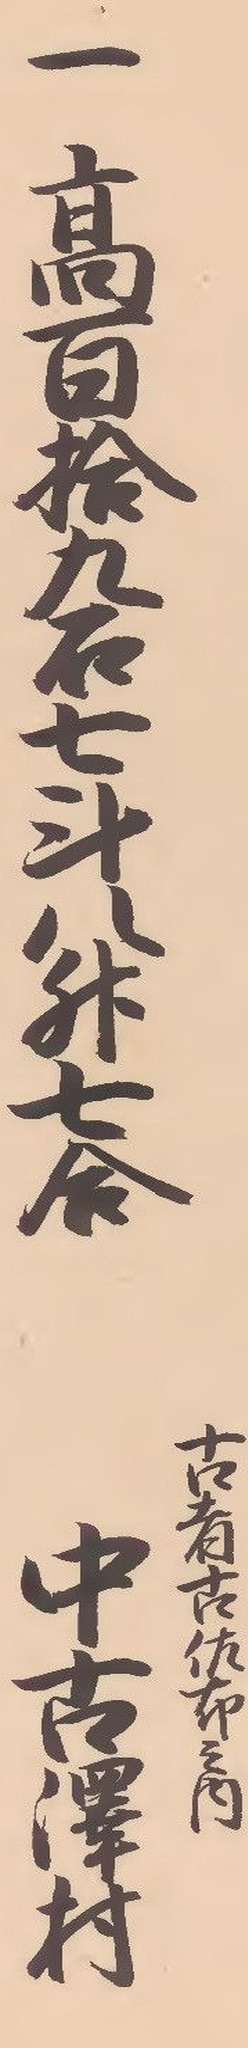一高百弐拾三石七斗八升九合細川村
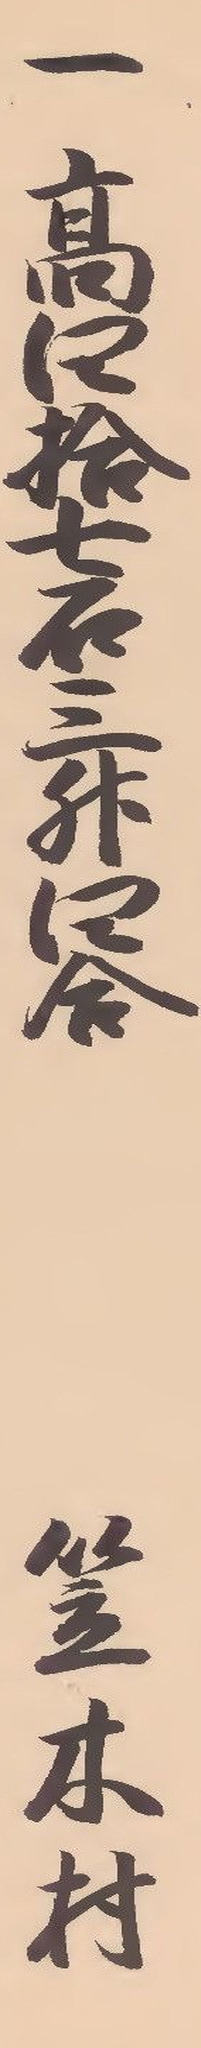一高四拾七石三升四合笠木村
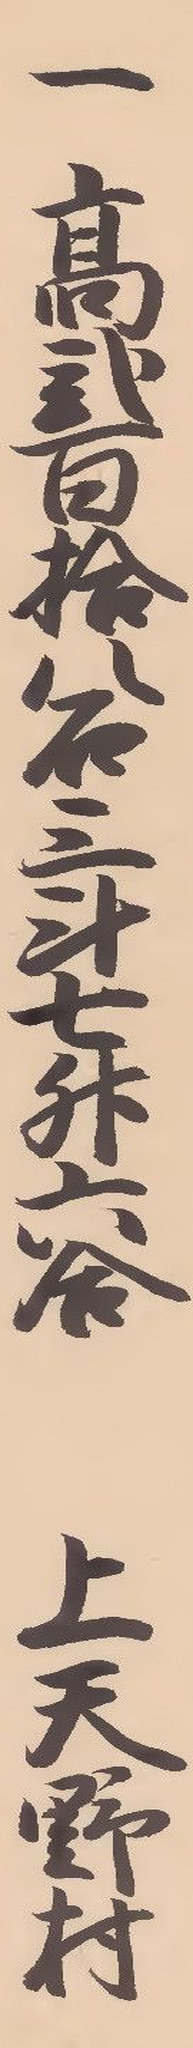一高弐百拾八石三斗七升六合上天野村

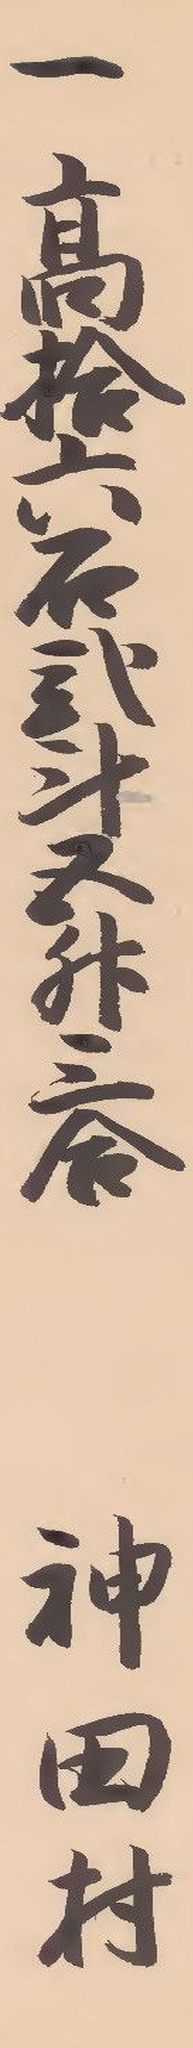一高拾六石弐斗五升三合神田村
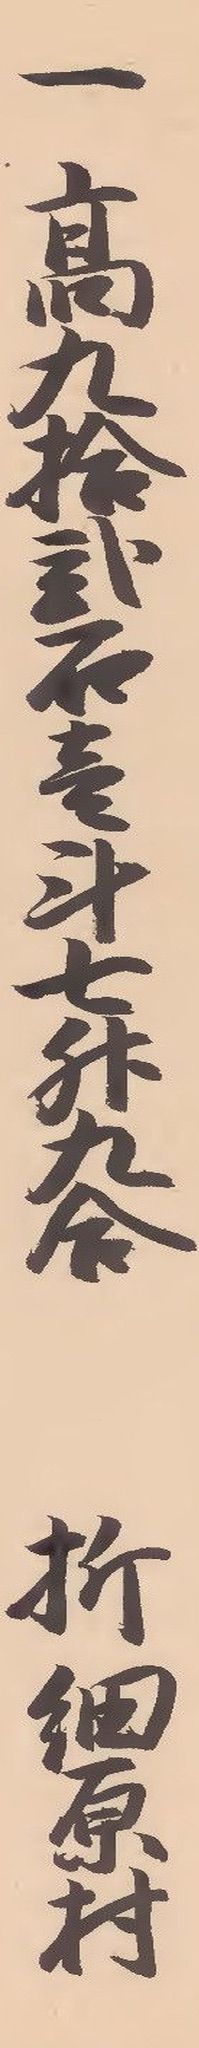一高九拾弐石壱斗七升九合折細原村
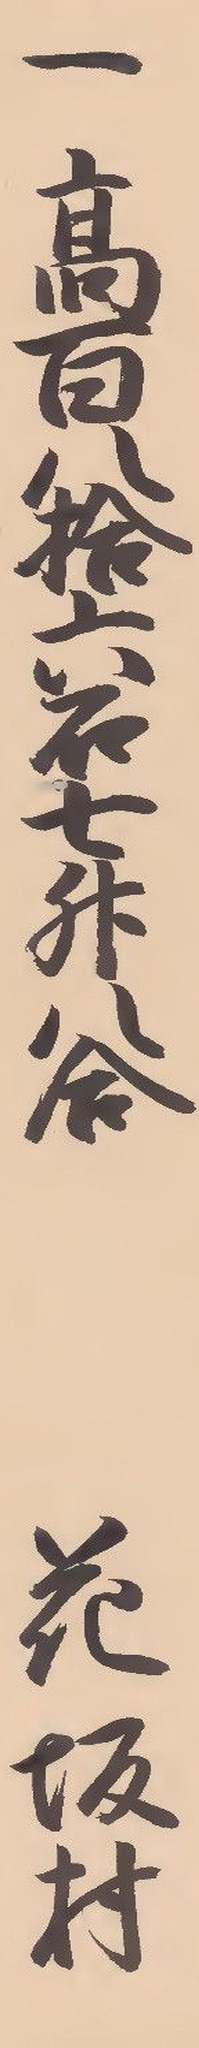一高百八拾六石七升八合花坂村

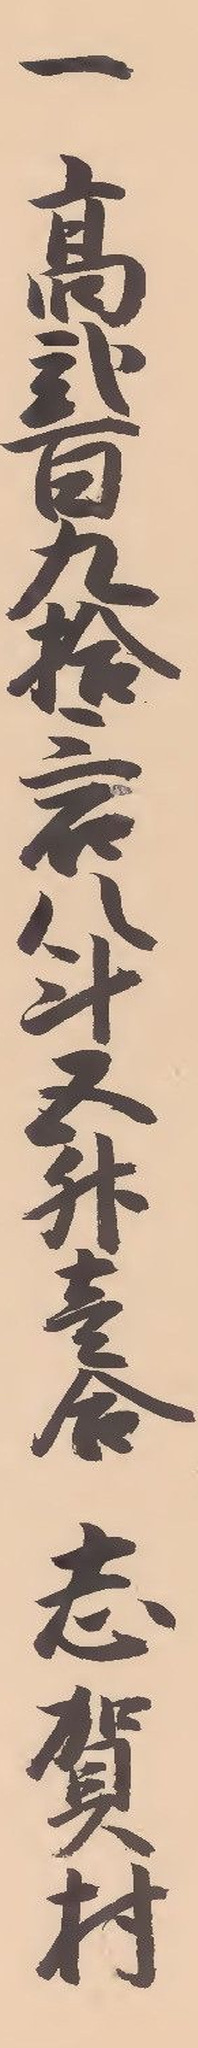一高弐百九拾三石八斗五升壱合志賀村
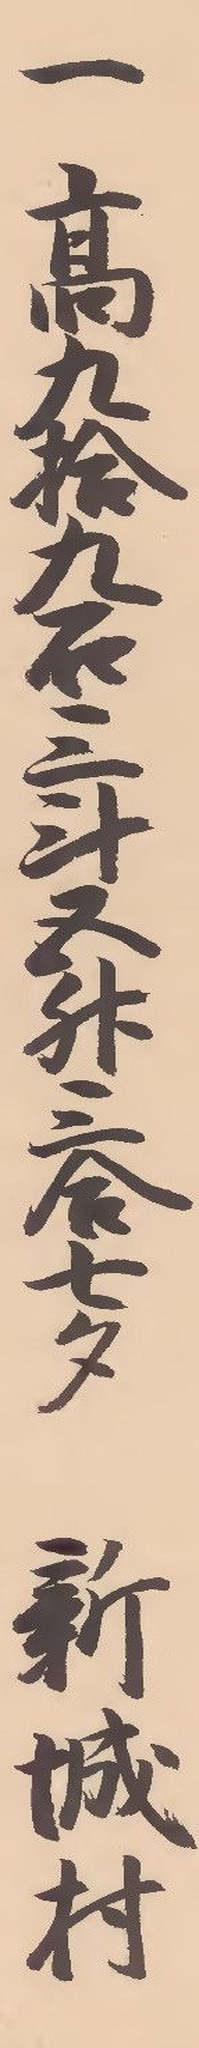一高九拾九石三斗五升三合七勺新城村
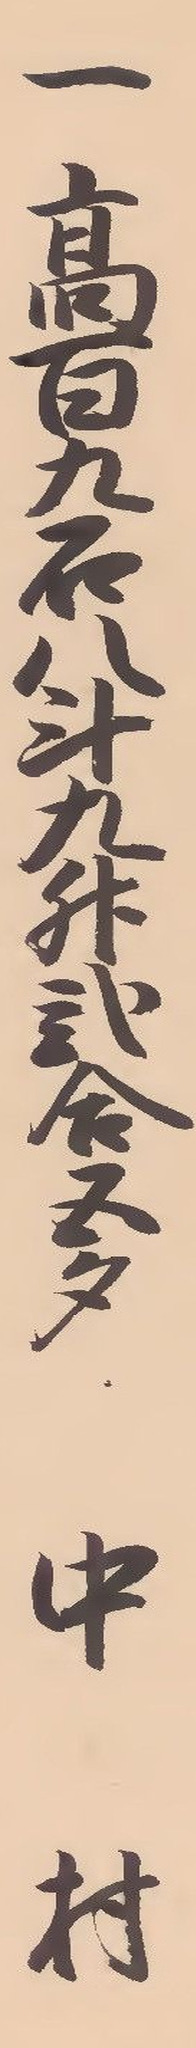一高百九石八斗九升弐合五勺中村
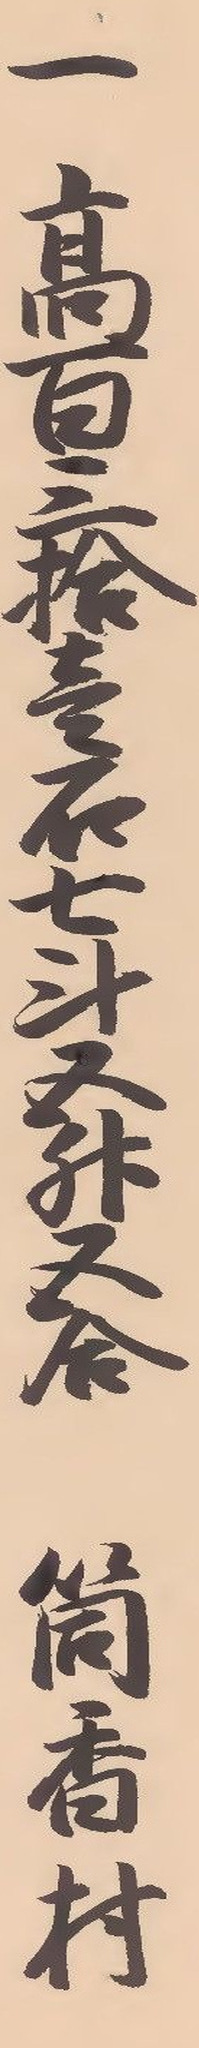一高百三拾壱石七斗五升五合筒香村
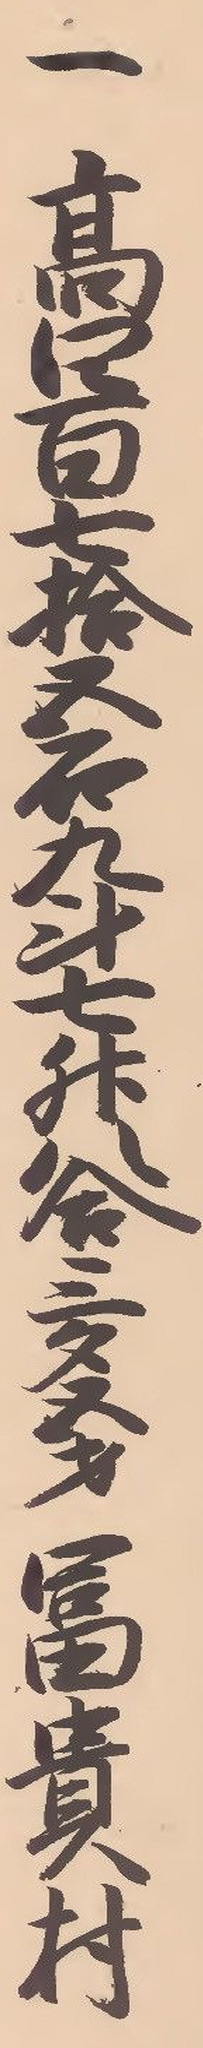一高四百七拾五石九斗七升八合三勺五才富貴村
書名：紀伊国郷帳
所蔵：国立公文書館 National Archives of Japan
